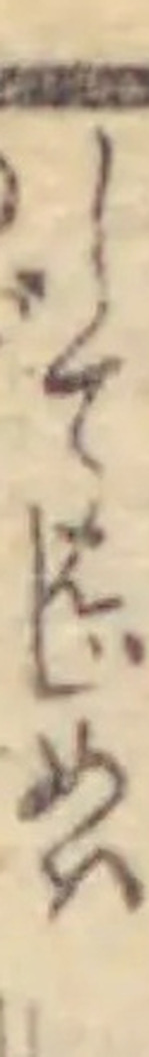してはじめは
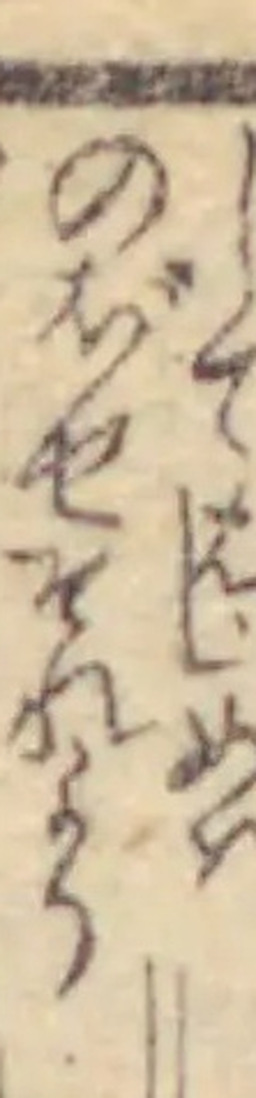のぼせそれより
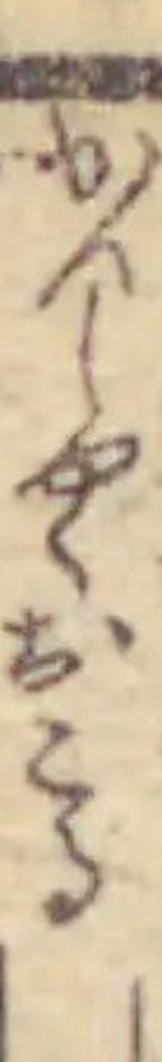かんしやくおこる
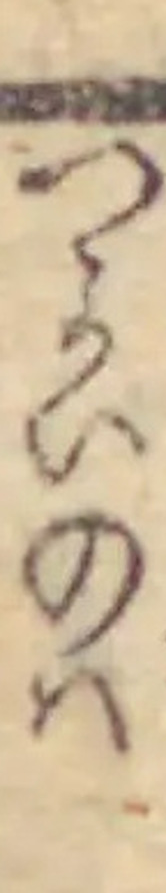つよいのは
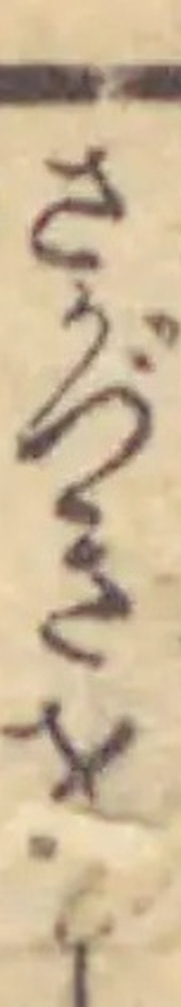さかづきを
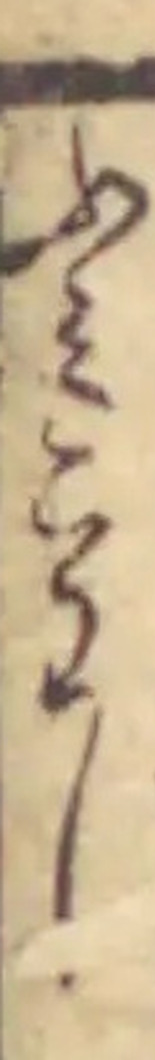ふみこわし
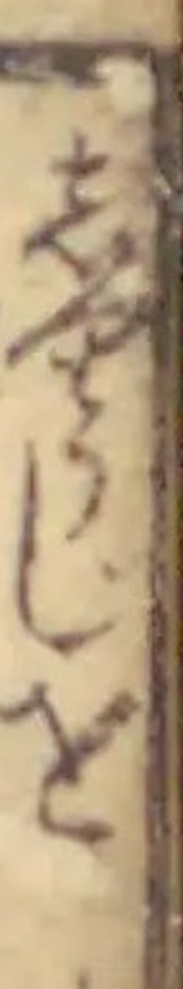しやうじを
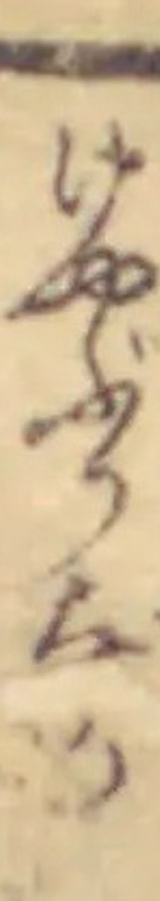けやぶりなか
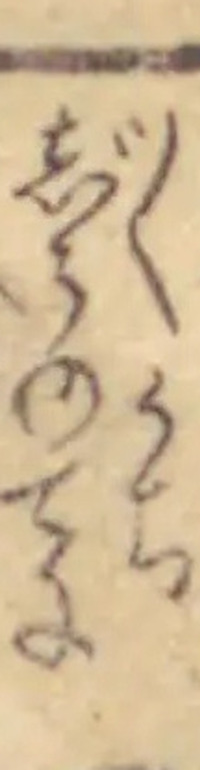じうのてに
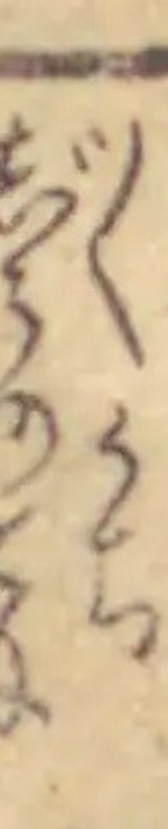じうのてに
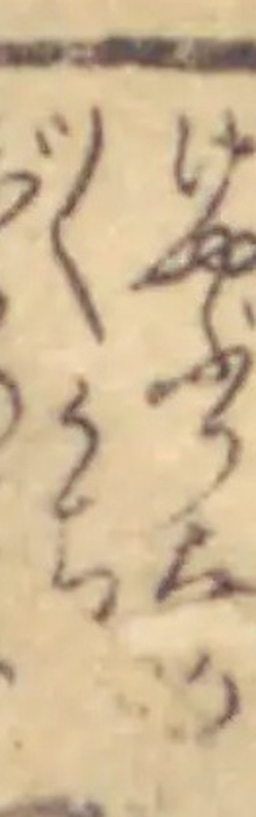〳〵うち
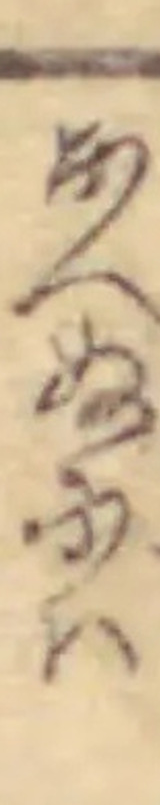おへぬには
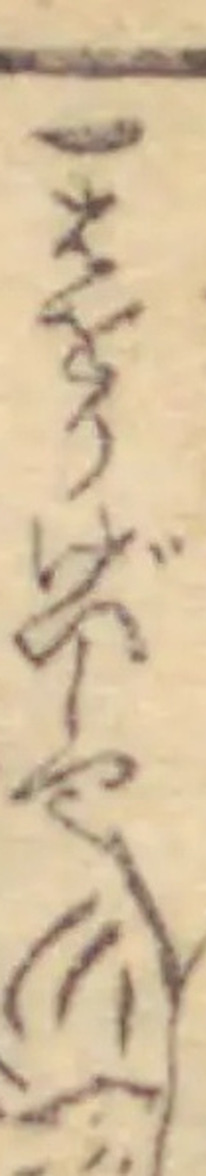一はをりげいしや
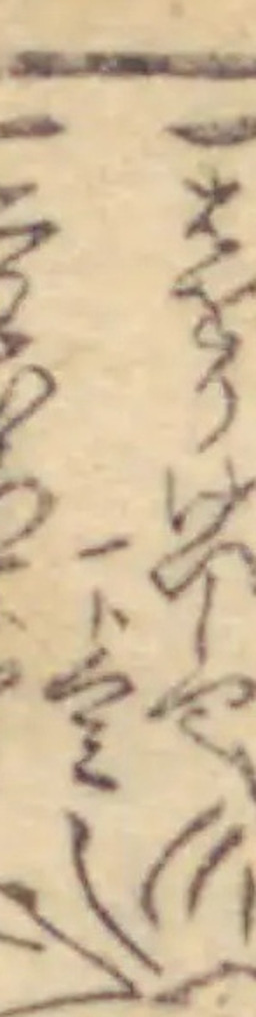一こわいろ一トくみ
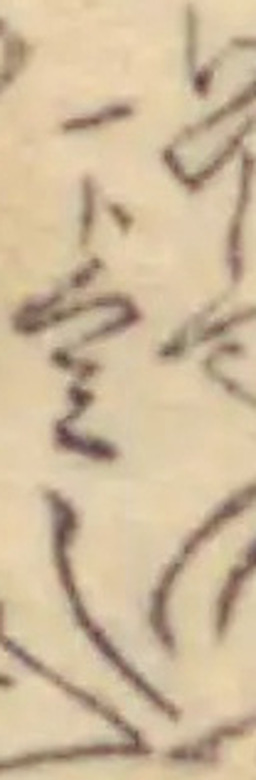一トくみ
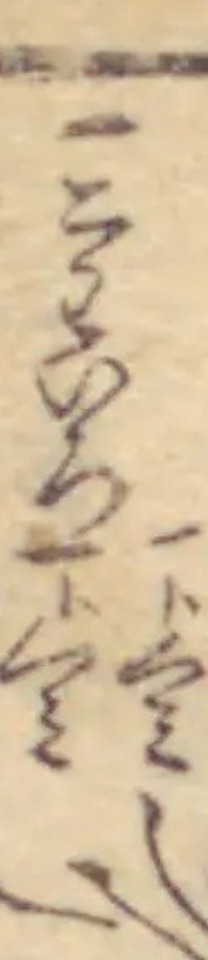一こわいろ一トくみ
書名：家伝寿命薬 2巻
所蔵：国立国会図書館 National Diet Library, JAPAN
